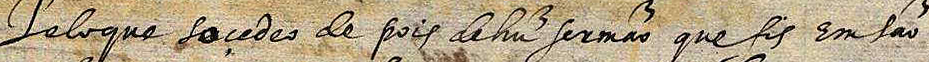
Pelo que soçedeo depois de hū sermão que fis Em saõ
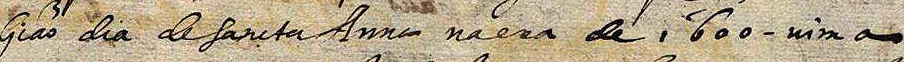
Gião dia de sancta Anna na era de 1600 - uim a
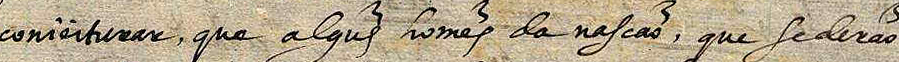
conieiturar que algūs homēs da nascaõ, que se deraõ
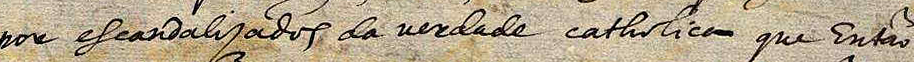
por escandalizados da uerdade catholica que Então
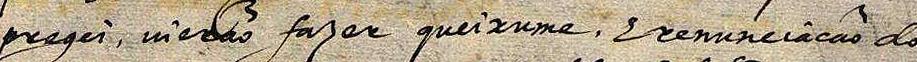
pregei, uierão fazer queixume. E renunciacão do
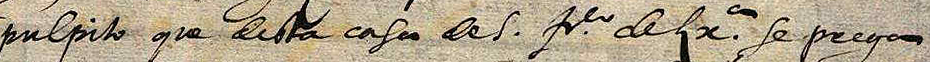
pulpito que desta casa de s. fr.co de Lx.a se prega
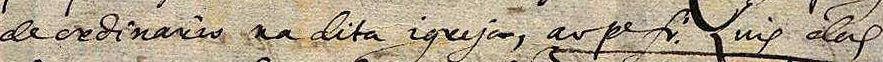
de ordinario na dita igreja, ao pe fr. Luis das
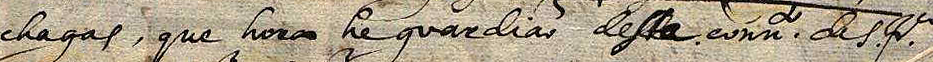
chagas, que hora he guardiaõ deste conuto. de s. fr.co
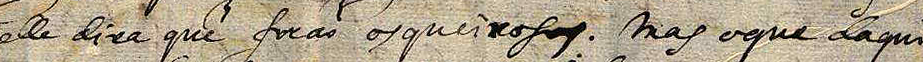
elle dira quē foraõ os queixosos. mas o que daqui
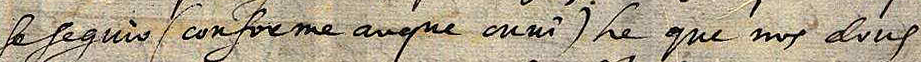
se seguio (conforme ao que ouui) he que nos dous
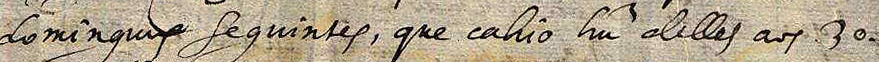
dominguos seguintes, que cahio hū delles aos 30.
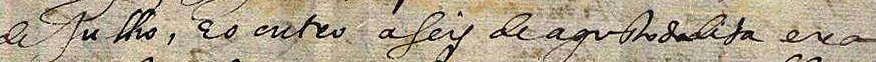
de Julho, E o outro a seis de agosto da dita era
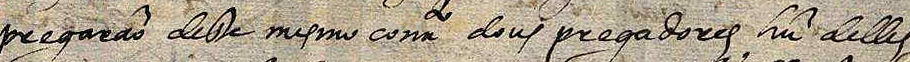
pregaraõ deste mesmo conuto dous pregadores hū delles
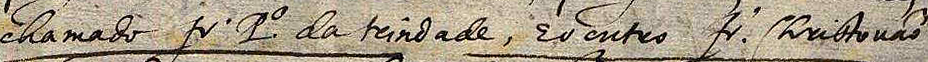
chamado fr. P.o da trindade, E o outro fr. Christouaõ
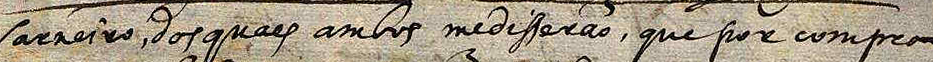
Carneiro, dos quaes ambos me disserão, que por compra
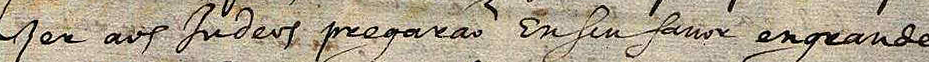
zer aos Judeos pregaraõ En seu fauor en grande
